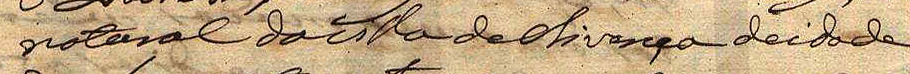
natural da villa de olivença de idade
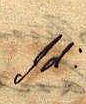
Jd:
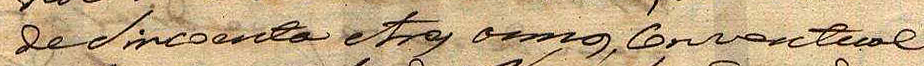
de Sincoenta e tres annos, conventual
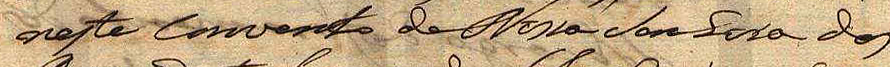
neste Convento de Nossa Senhora dos
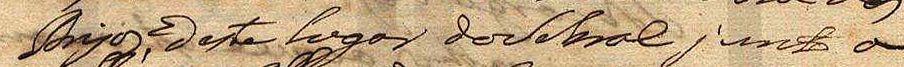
Anjos, deste lugar do Sobral junto a
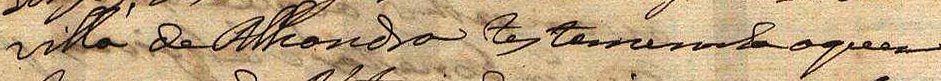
villa de Alhandra testemunha a quem
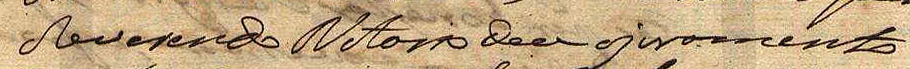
Reverendo Notario deu o juramento
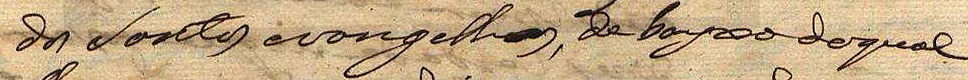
dos Santos evangelhos, debayxo do qual
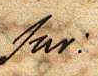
Jur:
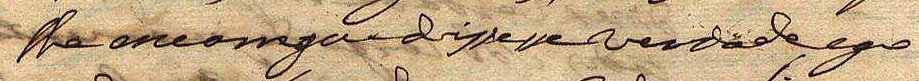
lhe encarrego dissesse verdade e go
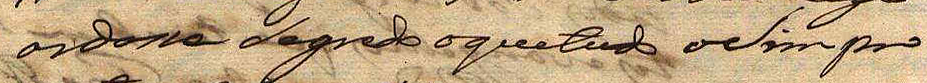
ardasse segredo o que tudo aSim pro
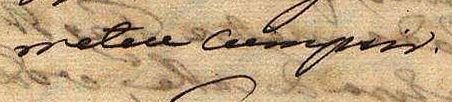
meteu cumprir.
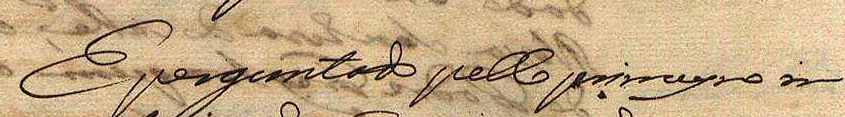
E perguntado pello primeyro in
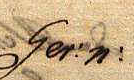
Ger: n:
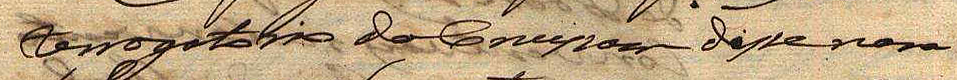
terrogatorio da Comissam disse nam
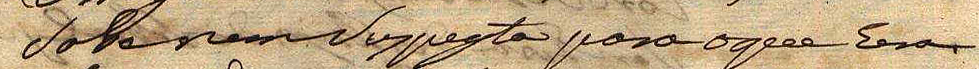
sabe nem suspeyta para o que hera
